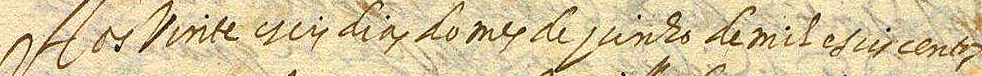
Aos vinte e seis dias do mes de junho de mil e seiscentos
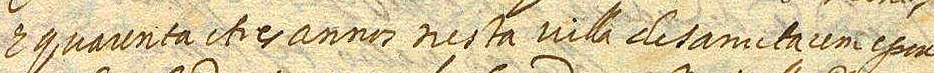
E quarenta e tres annos nesta uilla de samctarem e pou
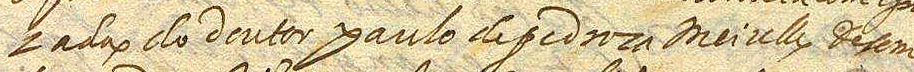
zadas do doutor paulo de pedroza meirelles desem
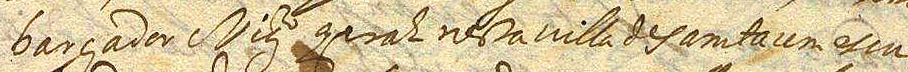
bargador e Vigro geral nesta uilla de samtarem e seu
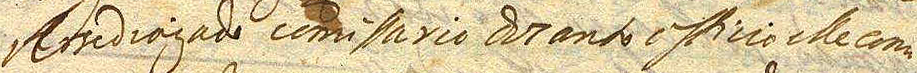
Arsediagado comissario do santo officio elle comi
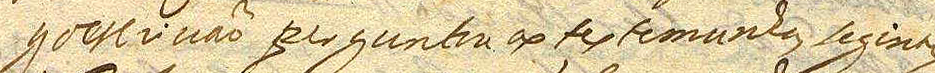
go escriuaõ perguntou as testemunhas segintes
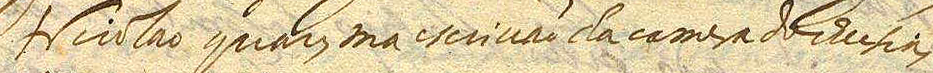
Nicolao quaresma escriuaõ da camera do Ecesias
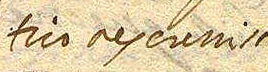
tico o escreui //
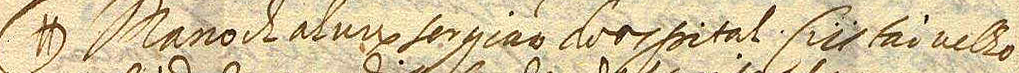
item Manoel alurs sergiaõ do ospital Cristaõ uelho
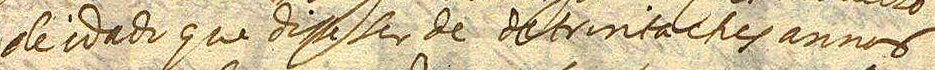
de idade que disse ser de de trinta e tres annos
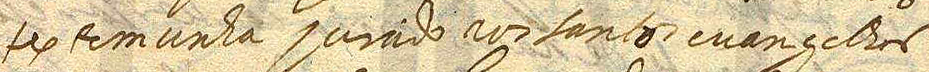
testemunha jurado aos santos euangelhos
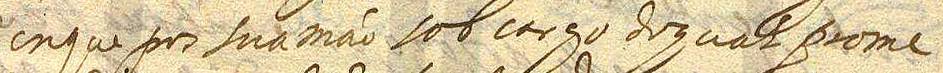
en que pos sua maõ sob cargo do qual prome
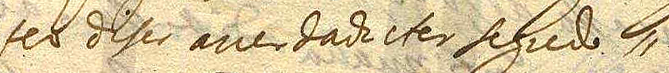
teo diser a uerdade e ter segredo //
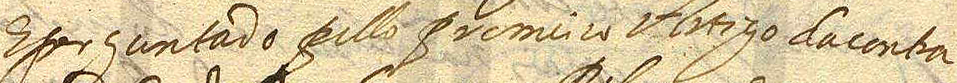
E perguntado pello primeiro Artigo da contra
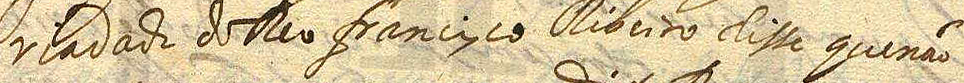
riadade do Reo francisco Ribeiro disse que naõ
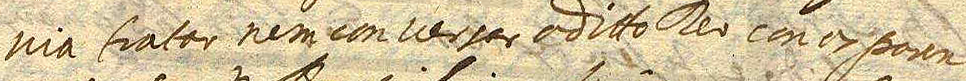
uia tratar nem conuersar o ditto Reo con os paren
